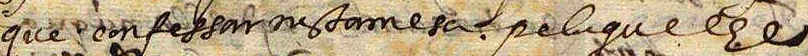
que confessar nesta mesa. pelo que lhe
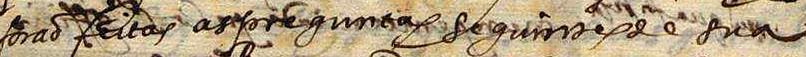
foraõ feitas as preguntas seguintes de sua
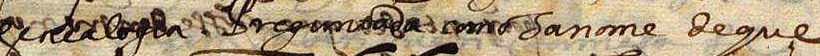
genealogia. Preguntada como ha nome de que
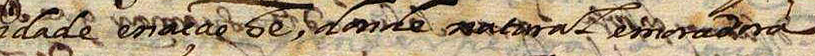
idade e naçaõ he, donde naturaL e moradora
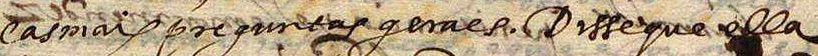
e as mais preguntas geraes. Disse que ella
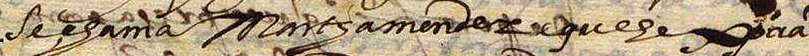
se chama Martha mendez e que he Xpaã
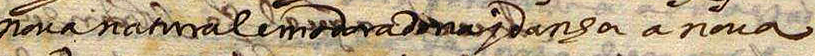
noua natural e moradora na jdanha a noua
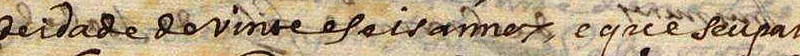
de idade de vinte e seis annos, e que seu pai
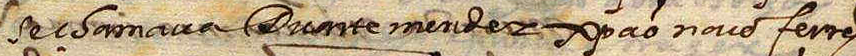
se chamaua Duarte mendez Xpaõ nouo ferrej
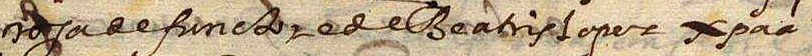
ro ja defuncto, e de Beatris lopez Xpaã
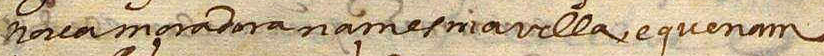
noua moradora na mesma villa e que nam
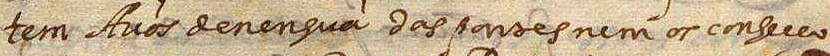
tem Auós de nenhuā das partes nem os conheçeo
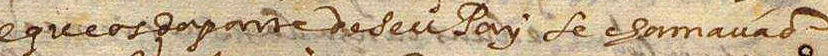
e que os da parte de seu Pay se chamauaõ
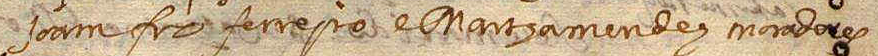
Joam frz̄ ferrejro e Martha mendez moradores
